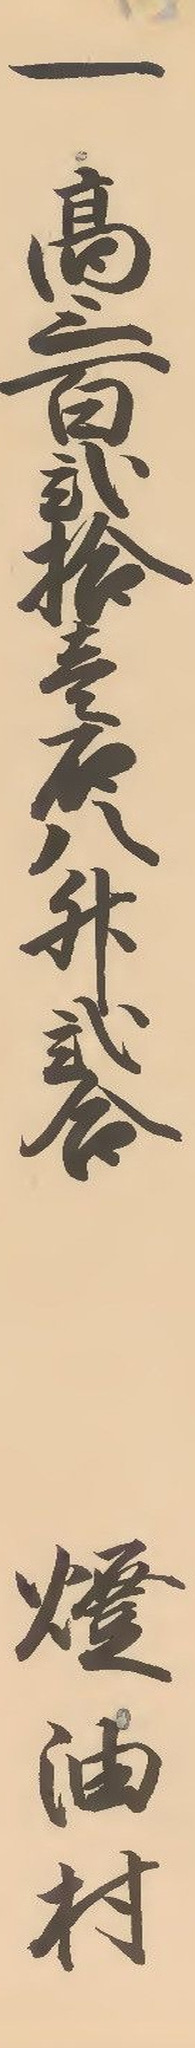一高三百弐拾壱石八升弐合灯油村
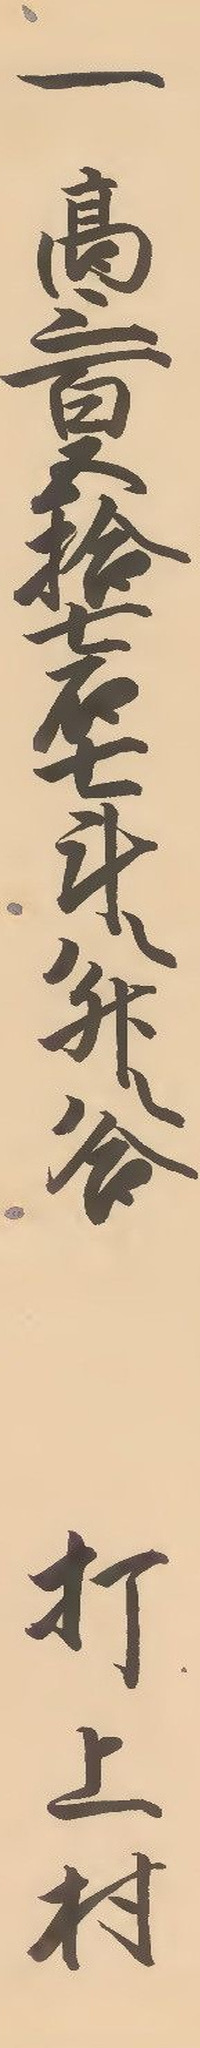一高三百五拾七石七斗八升八合打上村

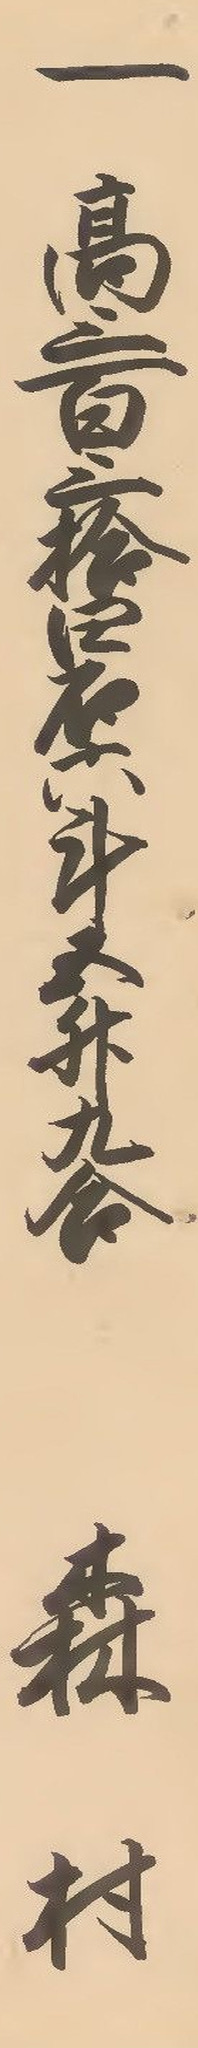一高三百三拾四石六斗五升九合森村
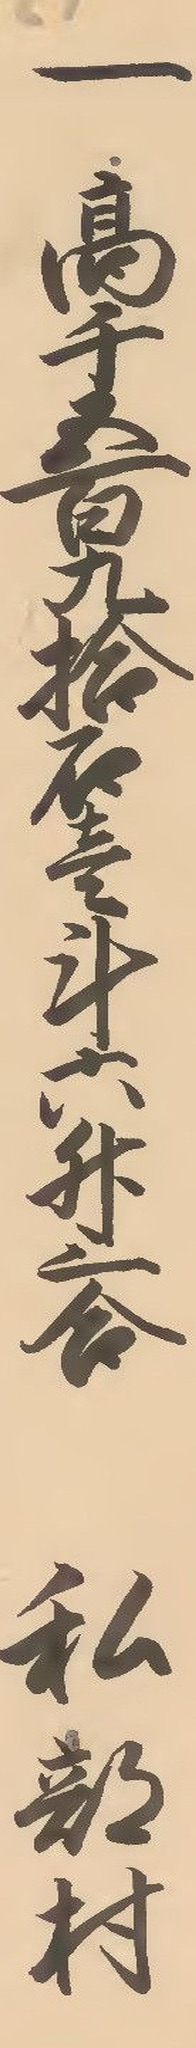一高千五百九拾石壱斗六升三合私部村
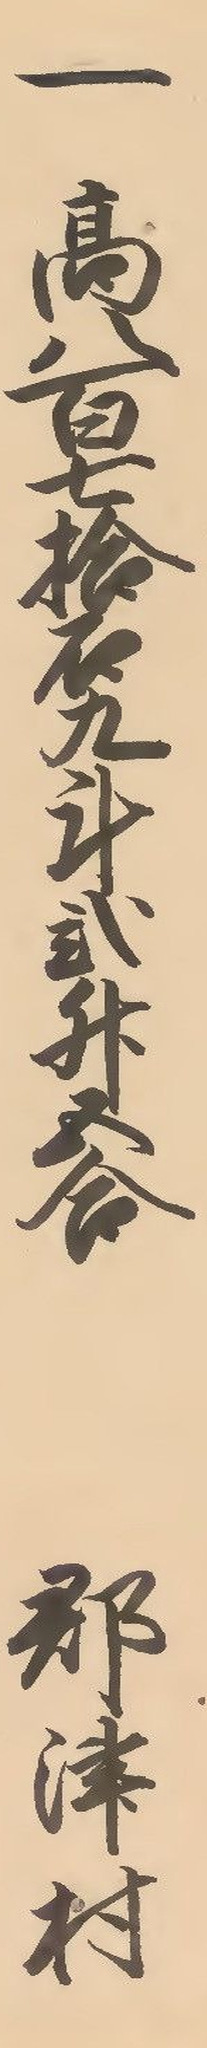一高八百七拾石九斗弐升五合郡津村
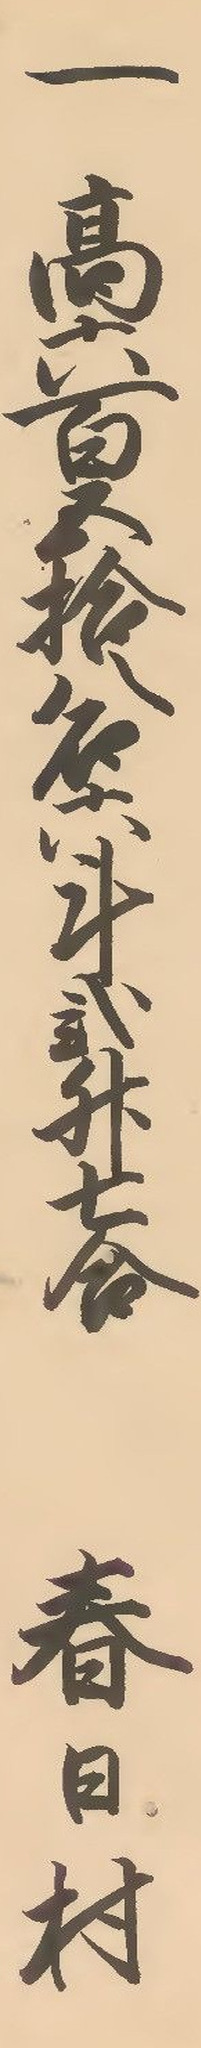一高六百五拾八石六斗弐升七合春日村
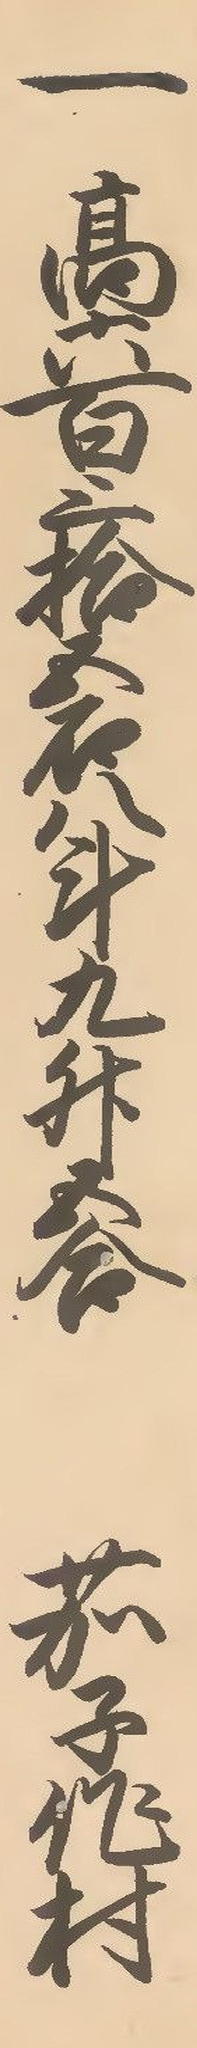一高六百三拾五石八斗九升五合茄子作村
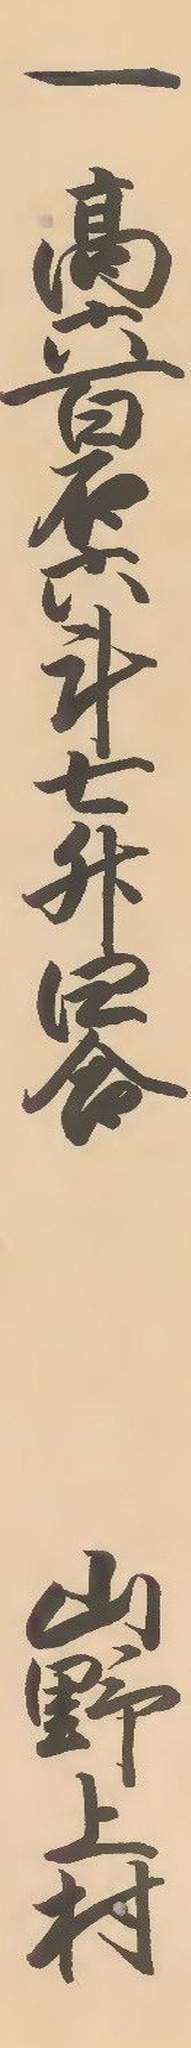一高六百石六斗七升四合山野上村
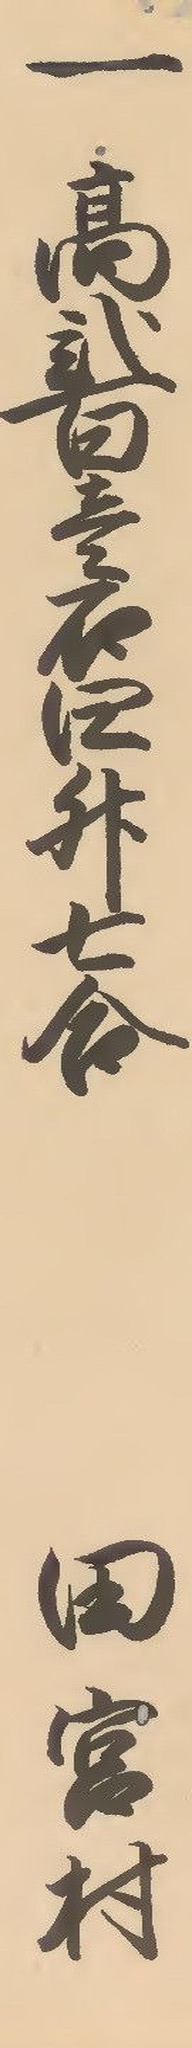一高弐百壱石四升七合田宮村
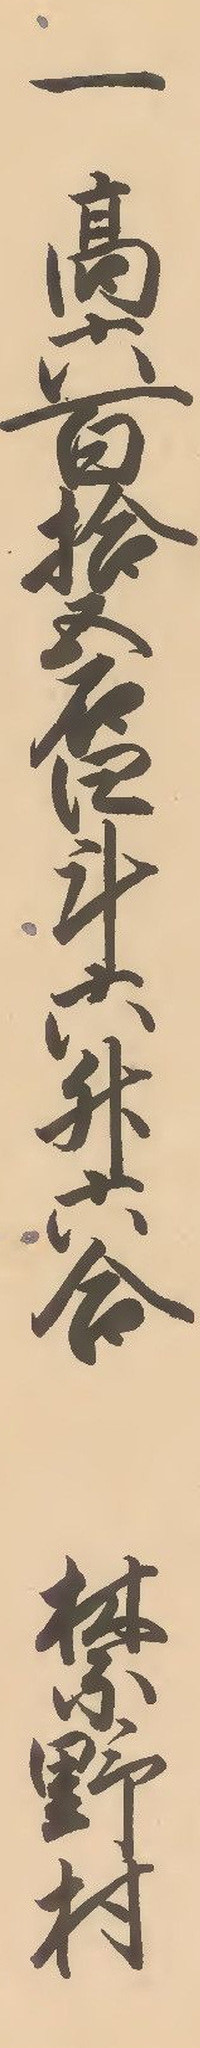一高六百拾五石四斗六升六合禁野村

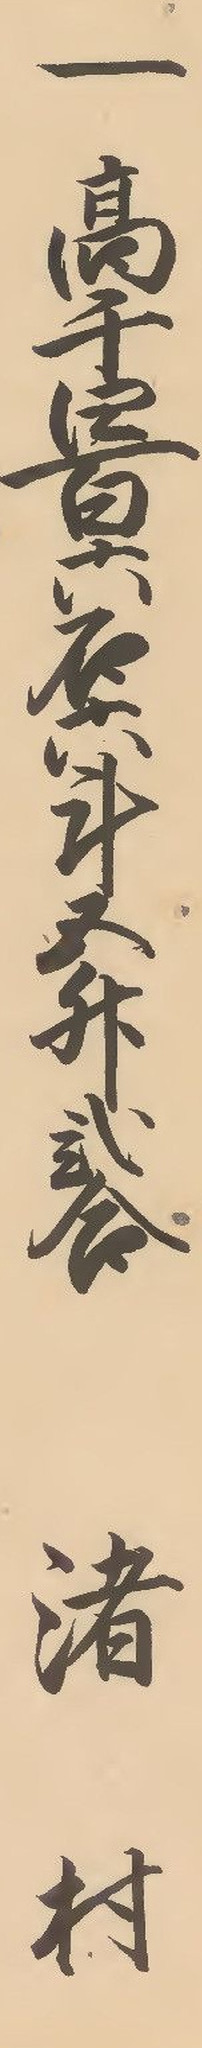一高千四百六石六斗五升弐合渚村
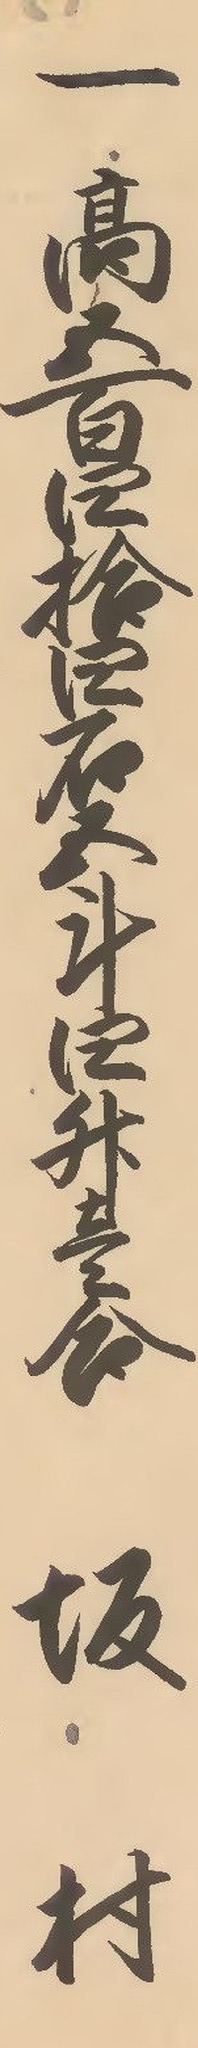一高五百四拾四石五斗四升壱合坂村
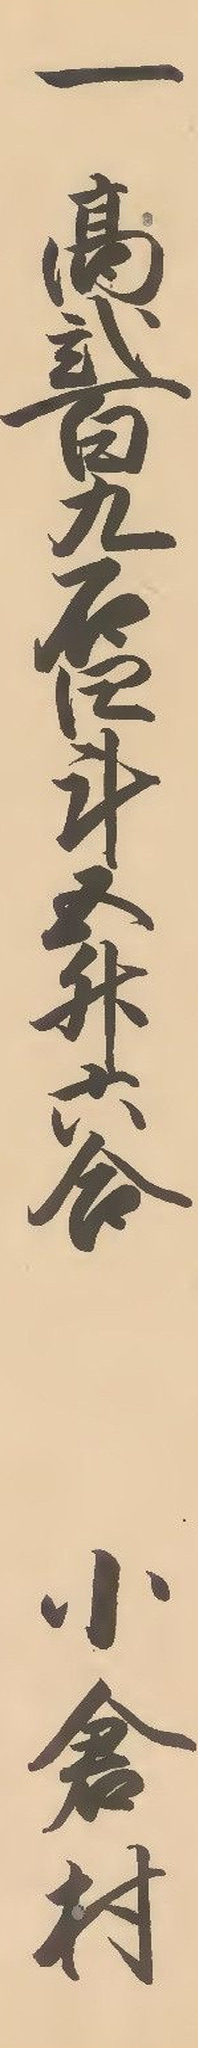一高弐百九石四斗五升六合小倉村
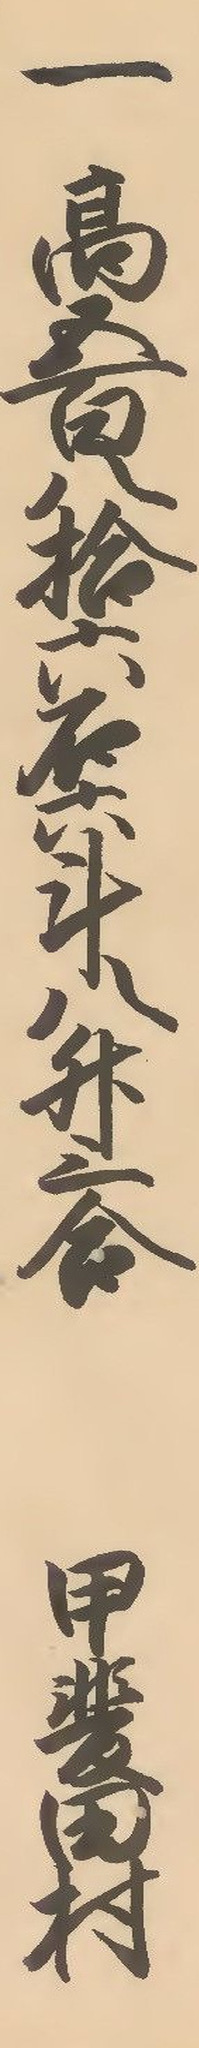一高五百八拾六石六斗八升三合甲斐田村
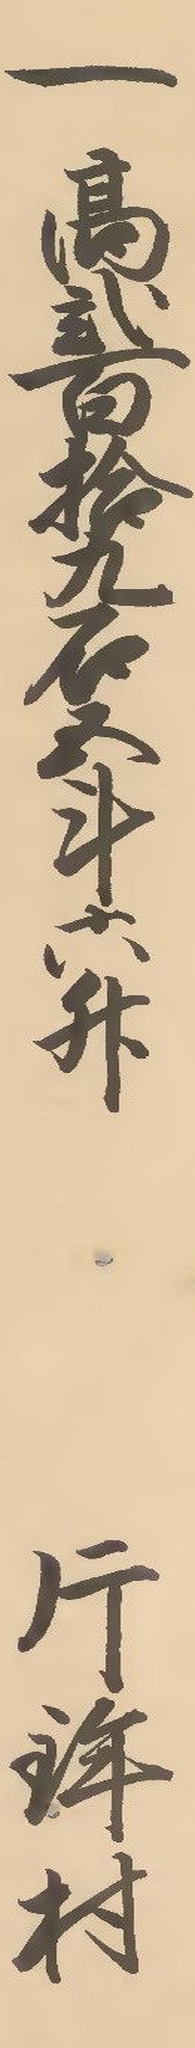一高弐百拾九石五斗六升片鉾村
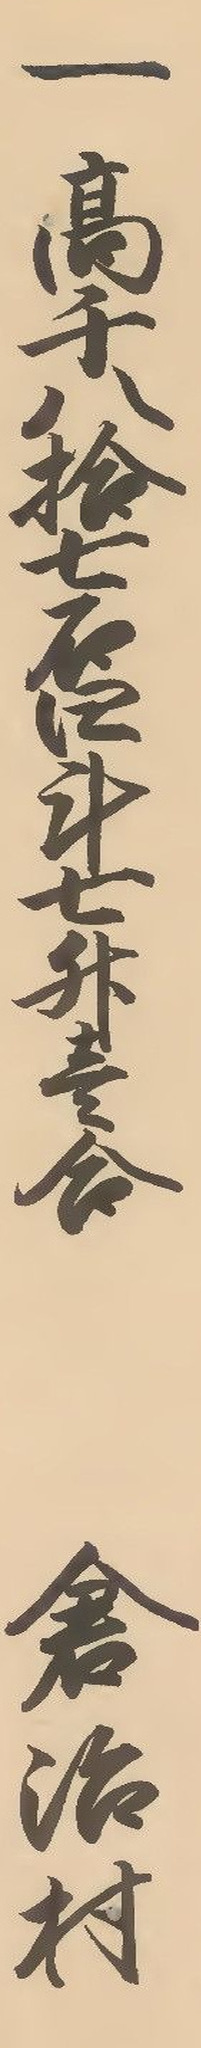一高千八拾七石四斗七升壱合倉治村
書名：河内国郷帳
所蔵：国立公文書館 National Archives of Japan
